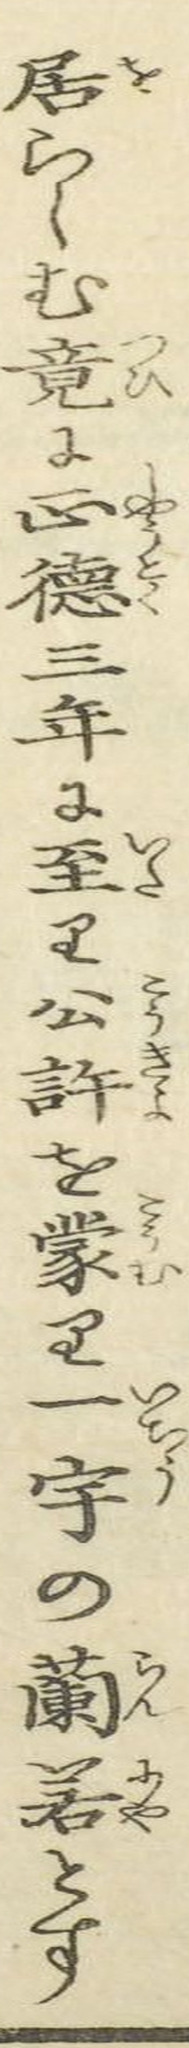居らしむ竟に正德三年に至り公許を蒙り一宇の蘭若とす
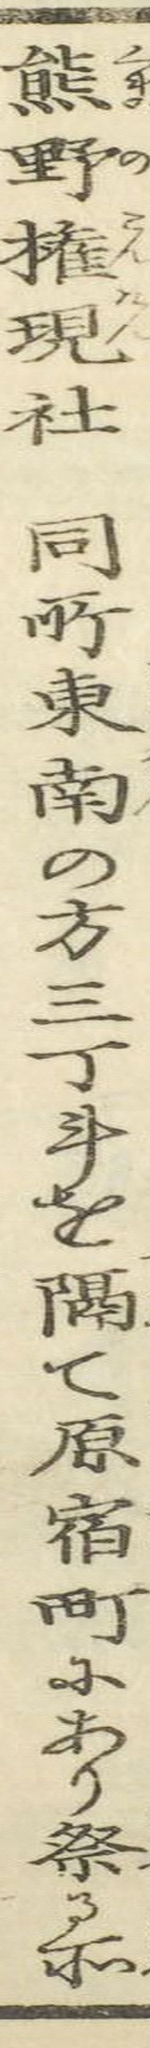熊野権現社同所東南の方三丁斗を隔て原宿町にあり祭る所
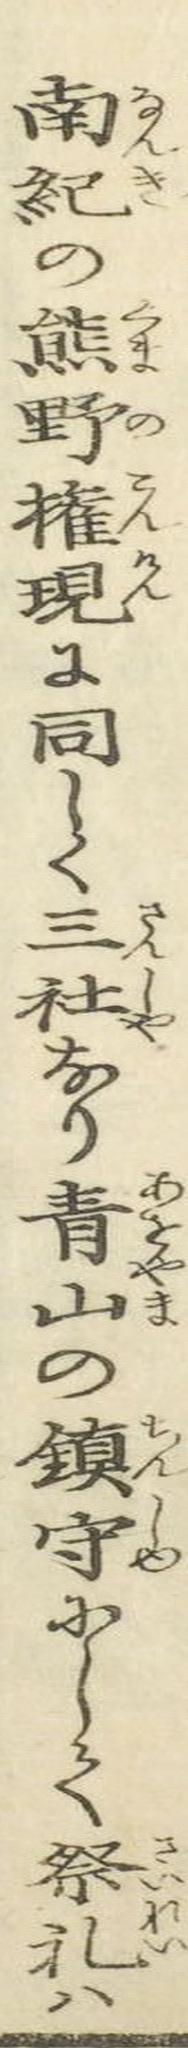南紀の熊野権現に同しく三社なり青山の鎮守にして祭礼は
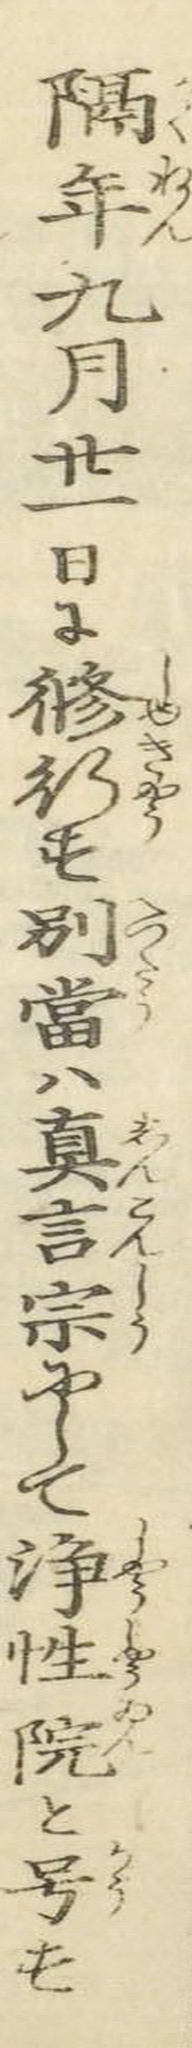隔年九月廿一日に修行す別當は真言宗にして浄性院と号す
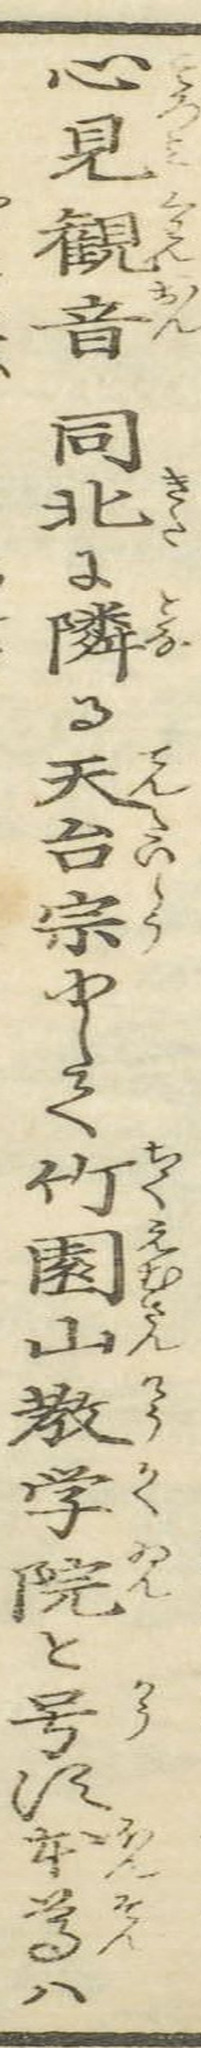心見観音同北に隣る天台宗にて竹園山教学院と号す本尊は
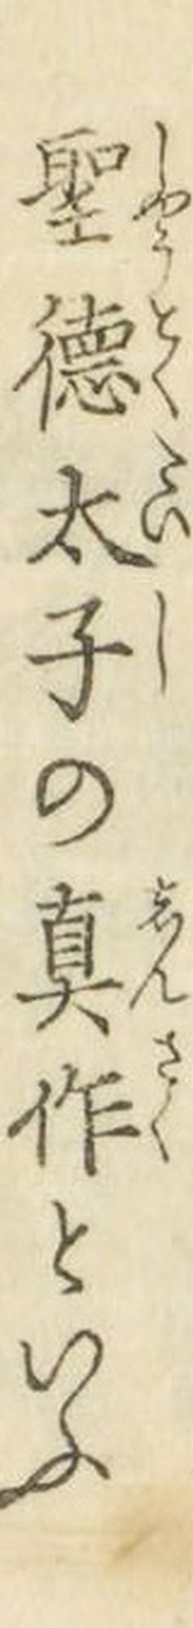聖徳太子の真作といふ
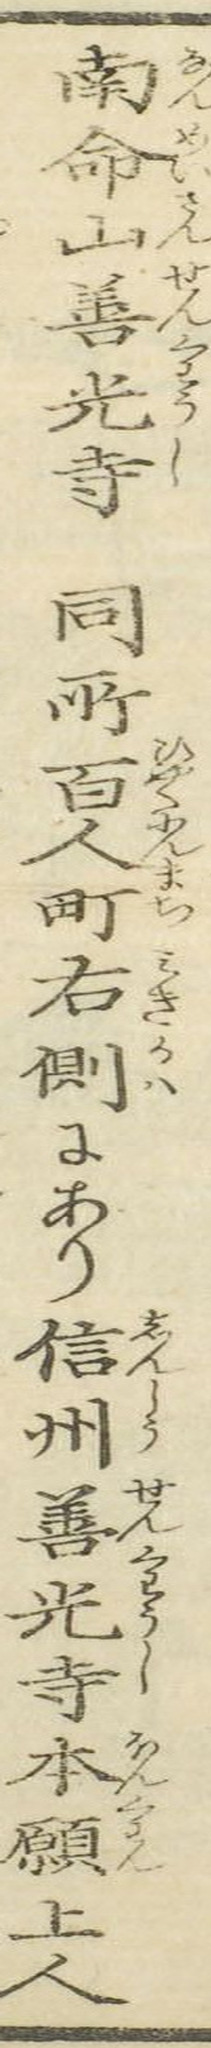南命山善光寺同所百人町右側にあり信州善光寺本願上人
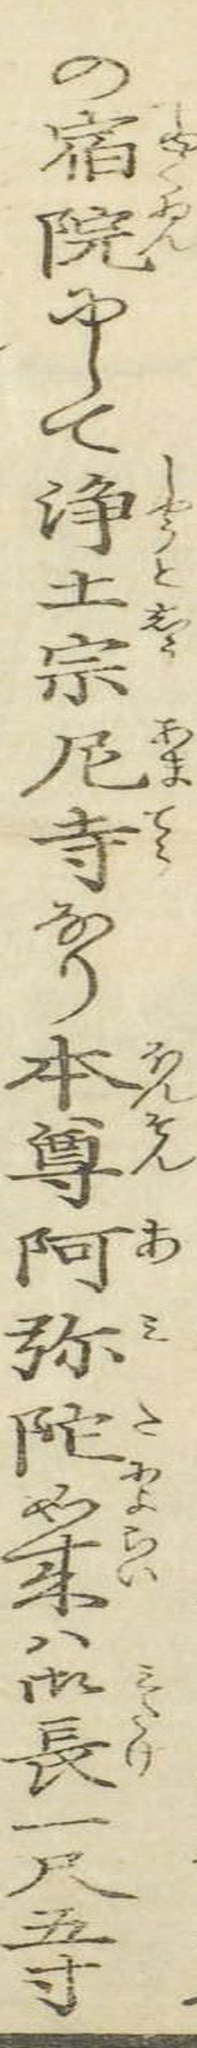の宿院にして浄土宗尼寺なり本尊阿弥陀如来は御長一尺五寸
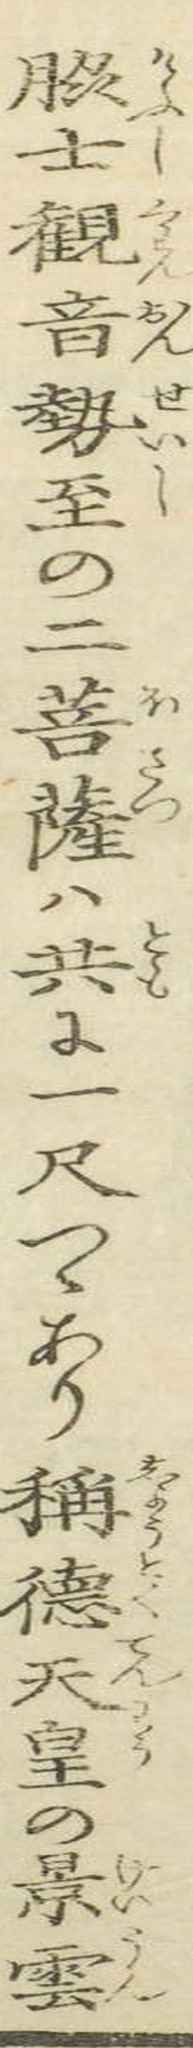脇士観音勢至の二菩薩は共に一尺つゝあり稱德天皇の景雲
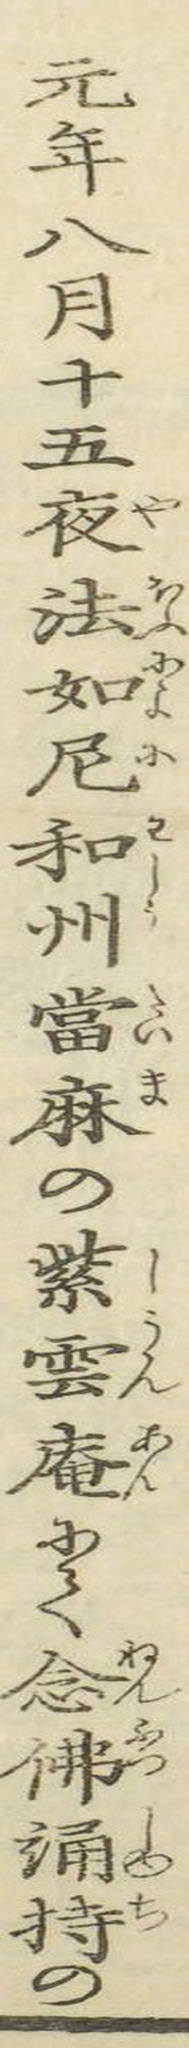元年八月十五日夜法如尼和州當麻の紫雲庵にて念佛誦持の
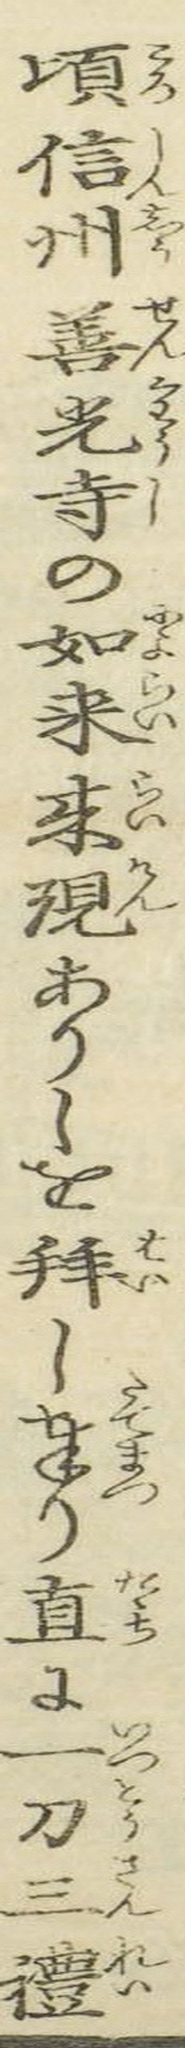頃信州善光寺の如来来現ありしを拜し奉り直に一刀三禮
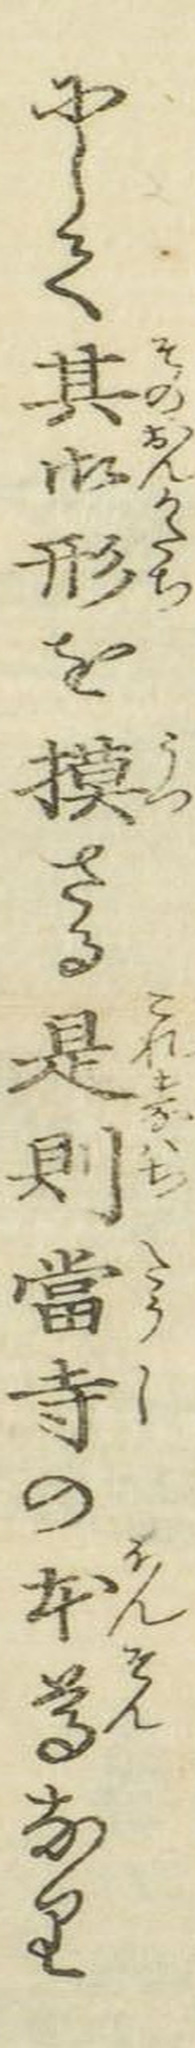にして其御形を摸さる是則當寺の本尊なり
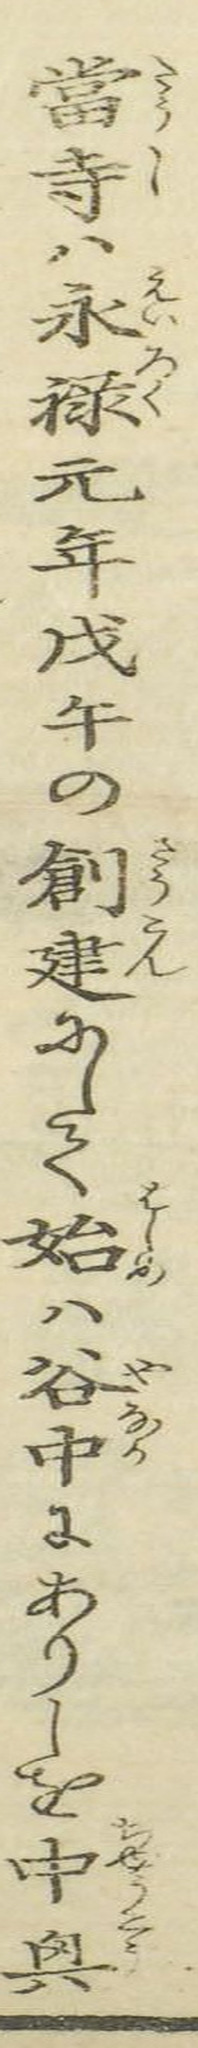當寺は永禄元年戊午の創建にして始は谷中にありしを中興
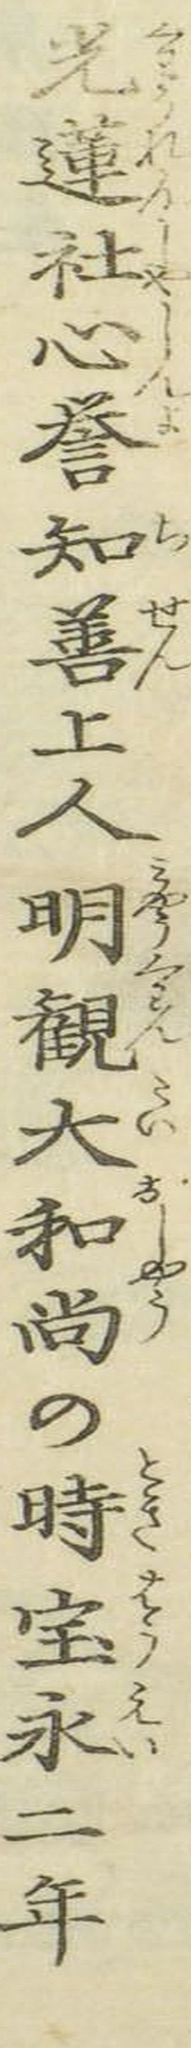光蓮社心誉知善上人明観大和尚の時宝永二年

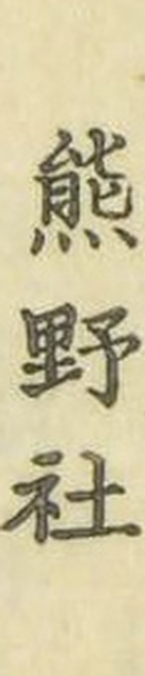熊野社

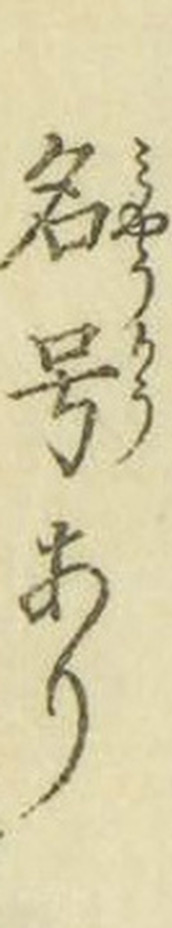名号あり
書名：江戸名所図会 20巻 巻之8
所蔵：東京学芸大学教育コンテンツアーカイブ
